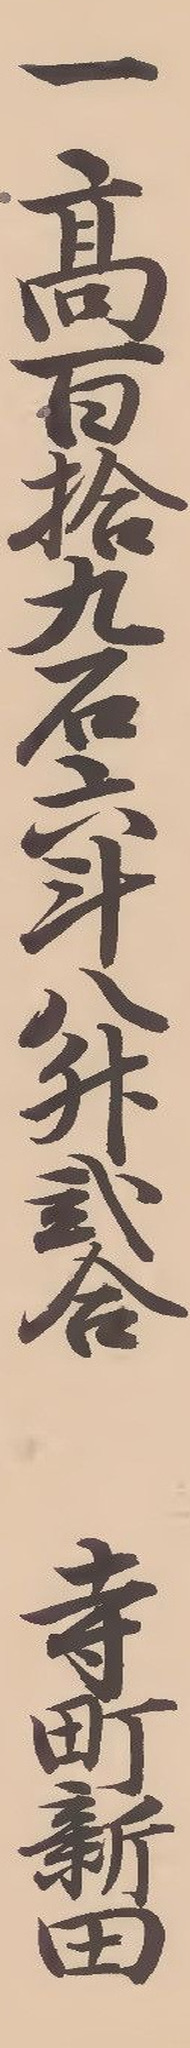一高百拾九石六斗八升弐合寺町新田
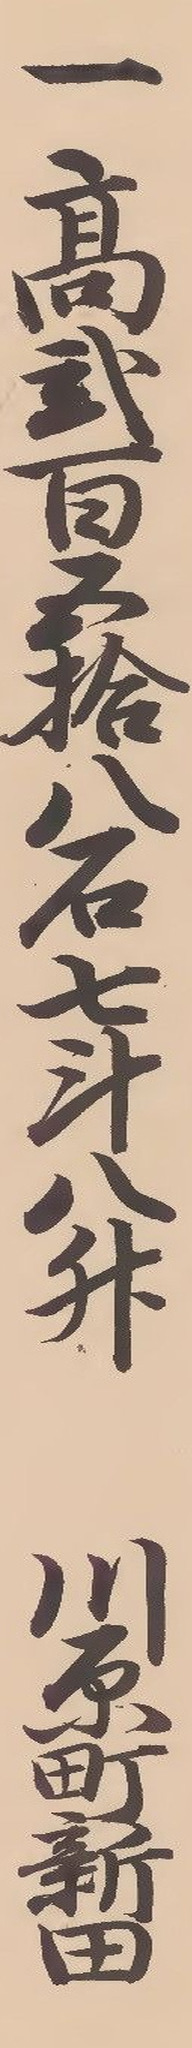一高弐百五拾八石七斗八升川原町新田
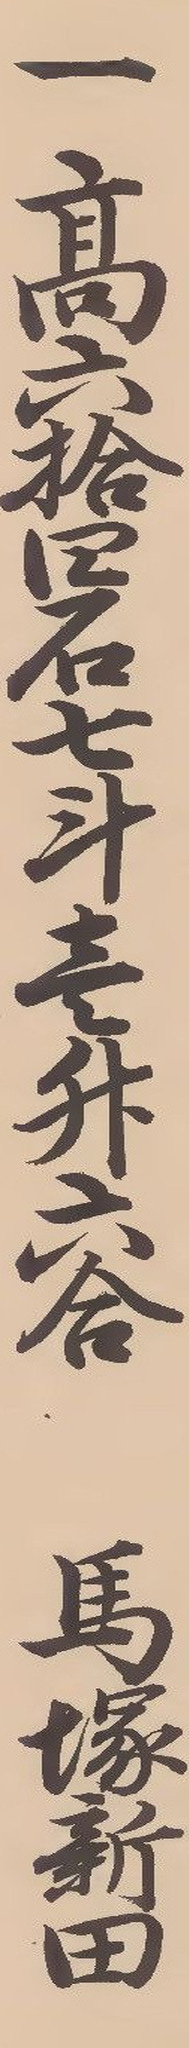一高六拾四石七斗壱升六合馬塚新田
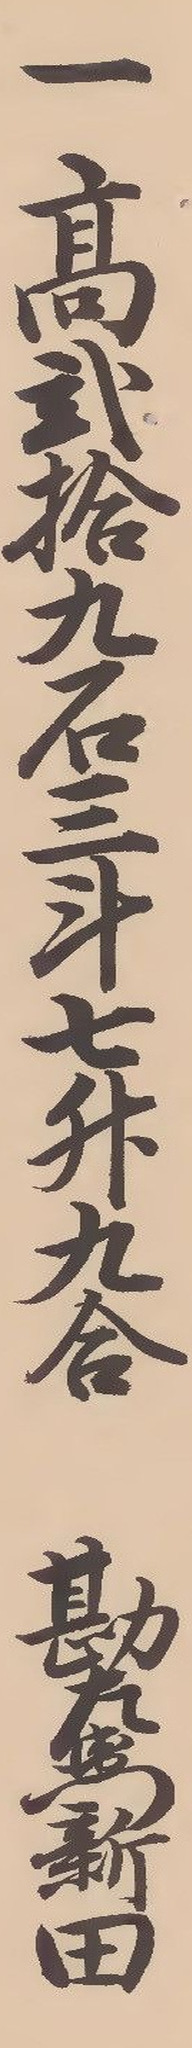一高弐拾九石三斗七升九合勘左衛門新田
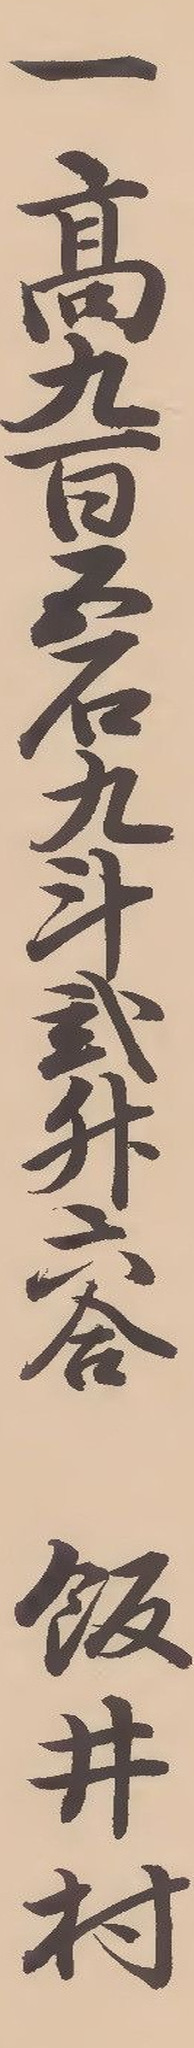一高九百五石九斗弐升六合飯井村
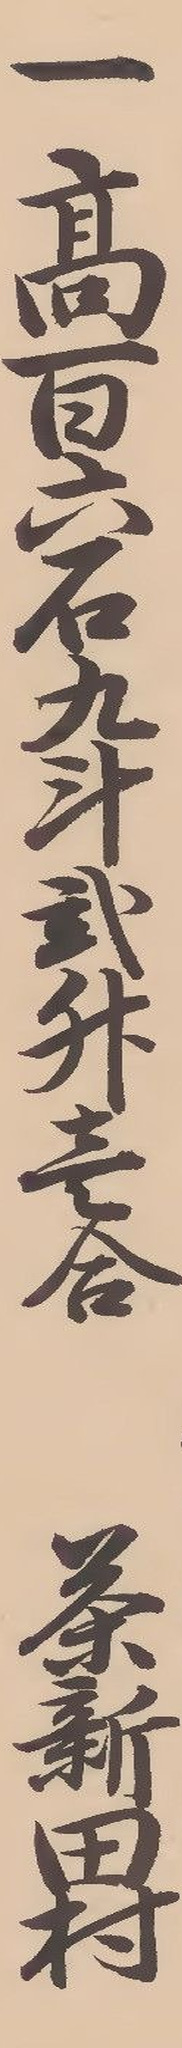一高百六石九斗弐升壱合茶新田村

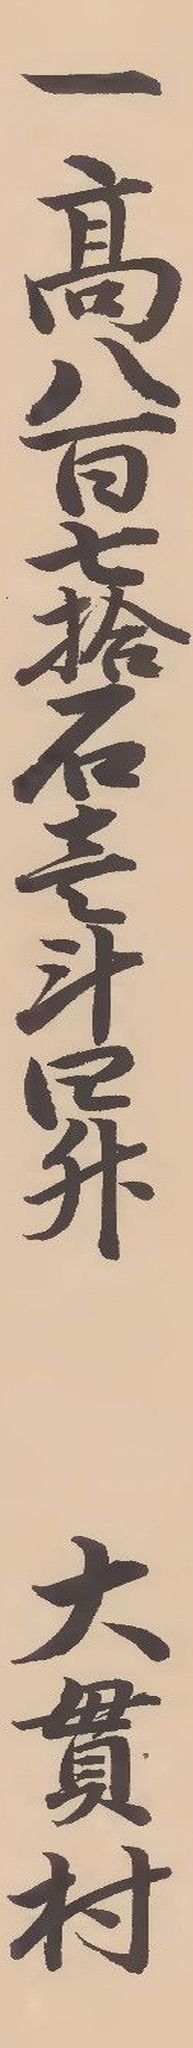一高八百七拾石壱斗四升大貫村
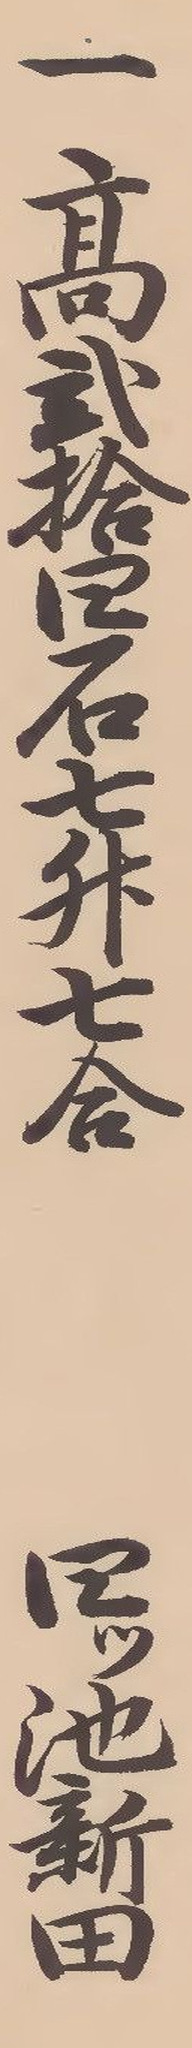一高弐拾四石七升七合四ツ池新田
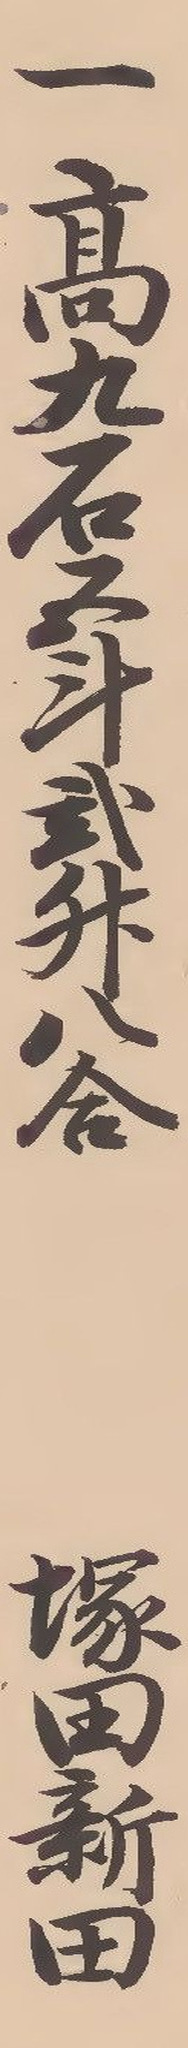一高九石五斗弐升八合塚田新田
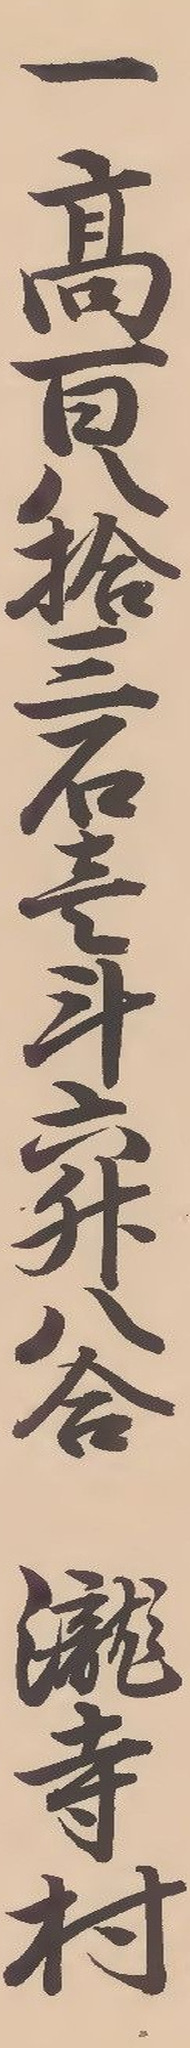一高百八拾三石壱斗六升八合滝寺村
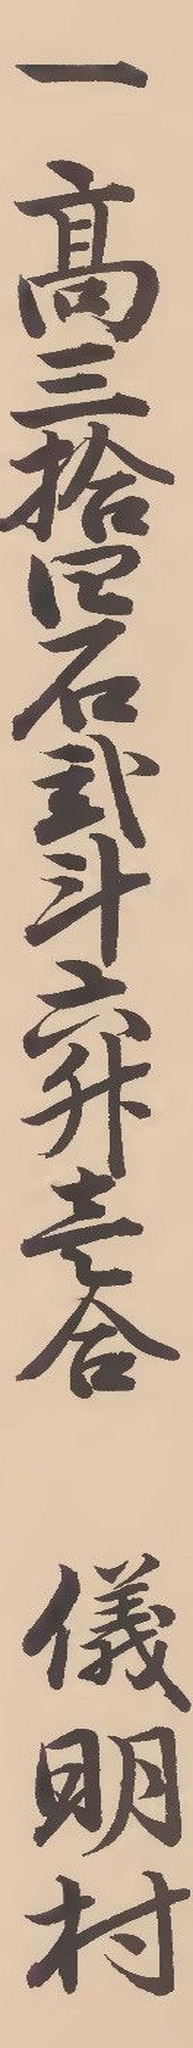一高三拾四石弐斗六升壱合儀明村
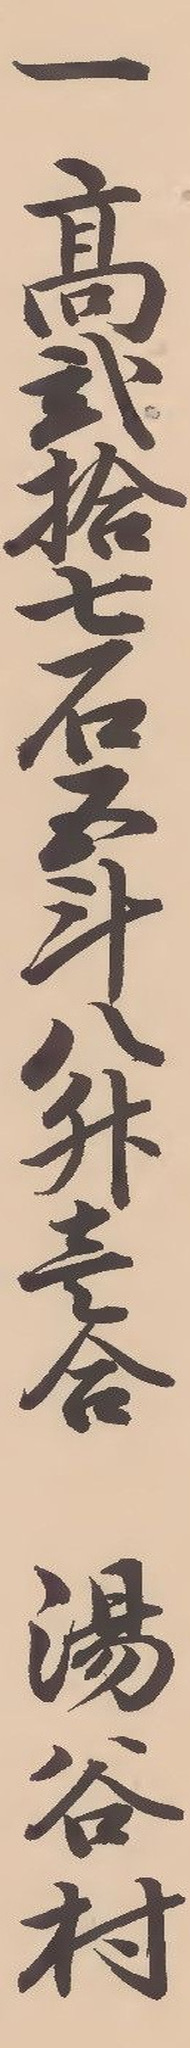一高弐拾七石五斗八升壱合湯谷村
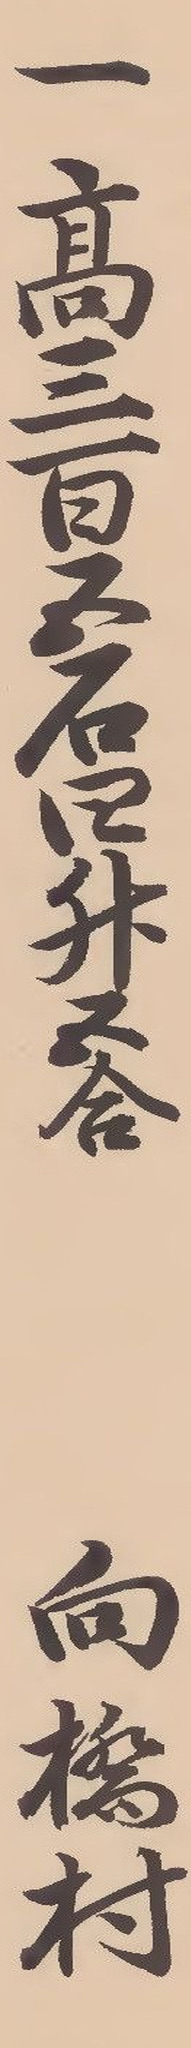一高三百五石四升五合向橋村
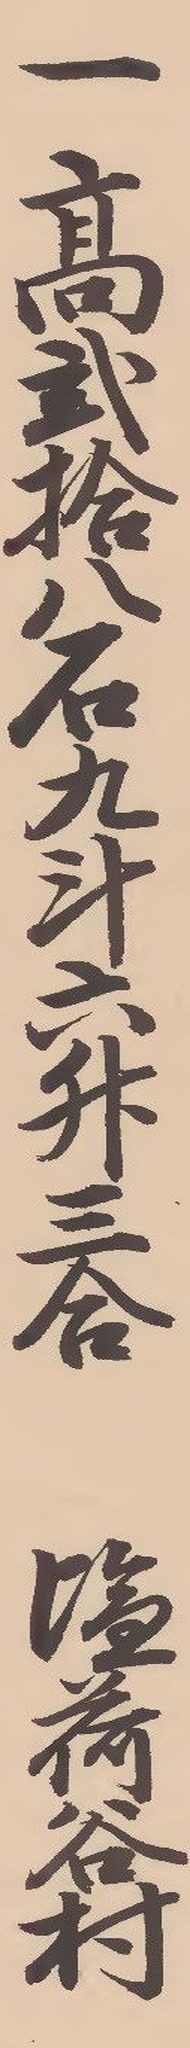一高弐拾八石九斗六升三合塩荷谷村

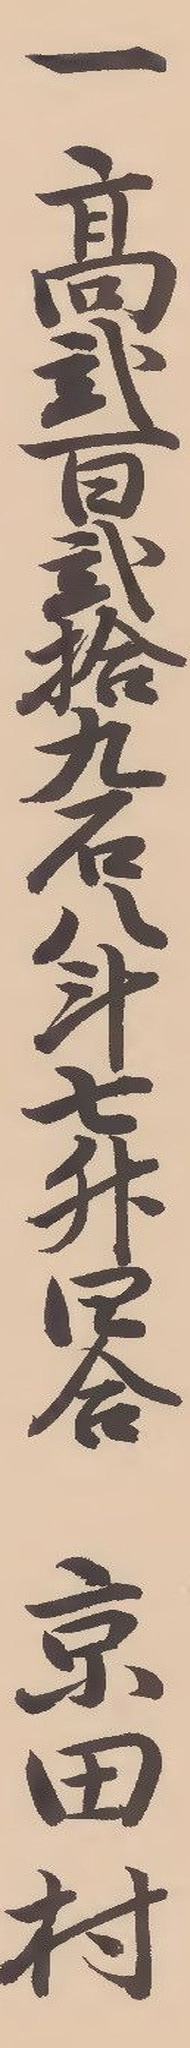一高弐百弐拾九石八斗七升四合京田村
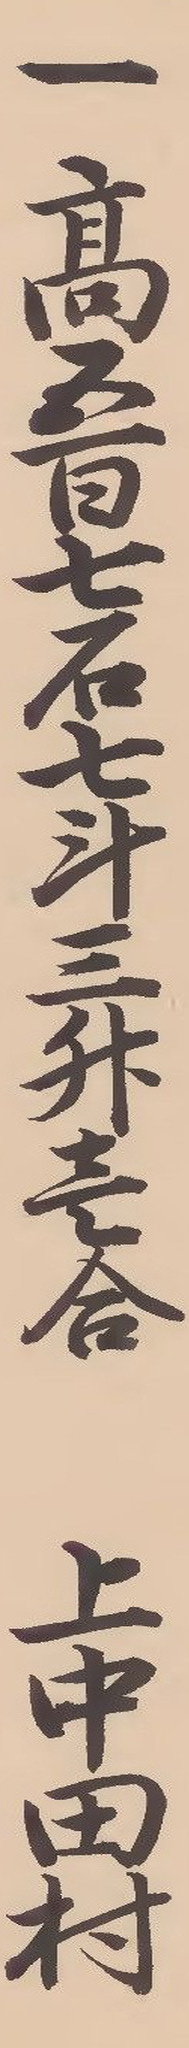一高五百七石七斗三升壱合上中田村
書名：越後国郷帳　上
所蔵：国立公文書館 National Archives of Japan
